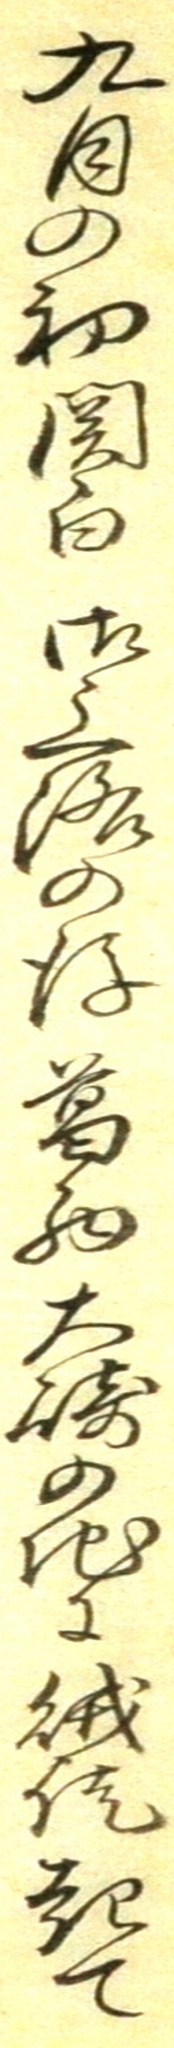九月の初関白御上洛の後葛西大崎の地に賊徒起て
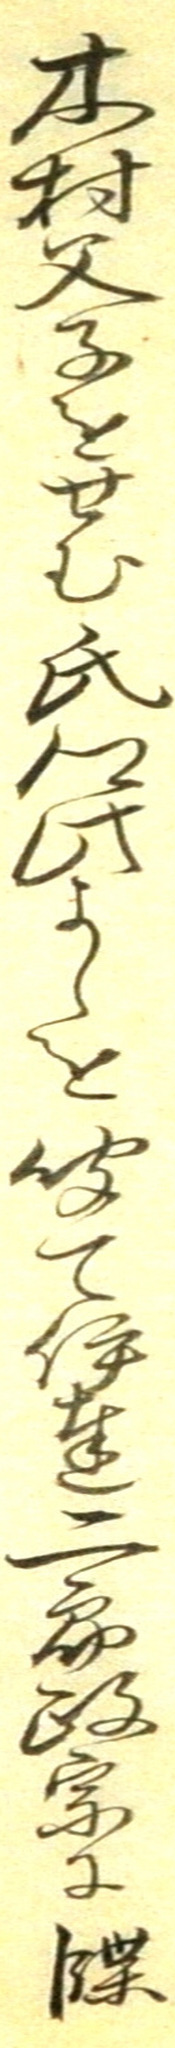木村父子をせむ氏郷此よしを聞て伊達二郎政宗に牒
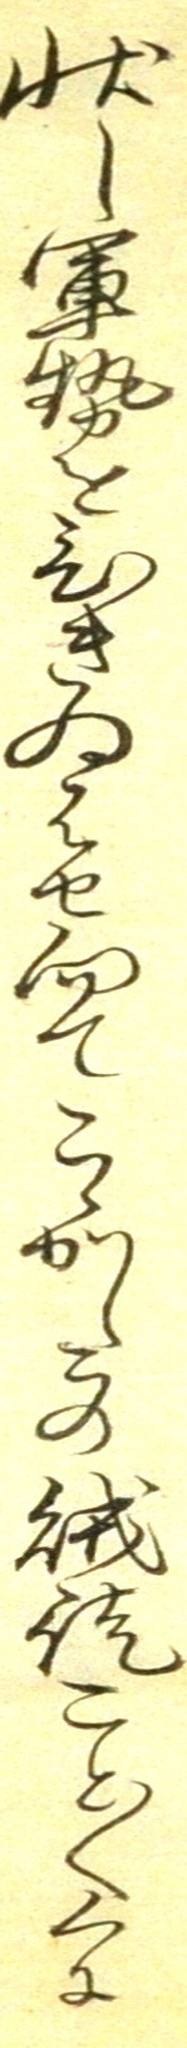状し軍勢をひきゐはせ向てこゝかしこの賊徒こと〳〵くに
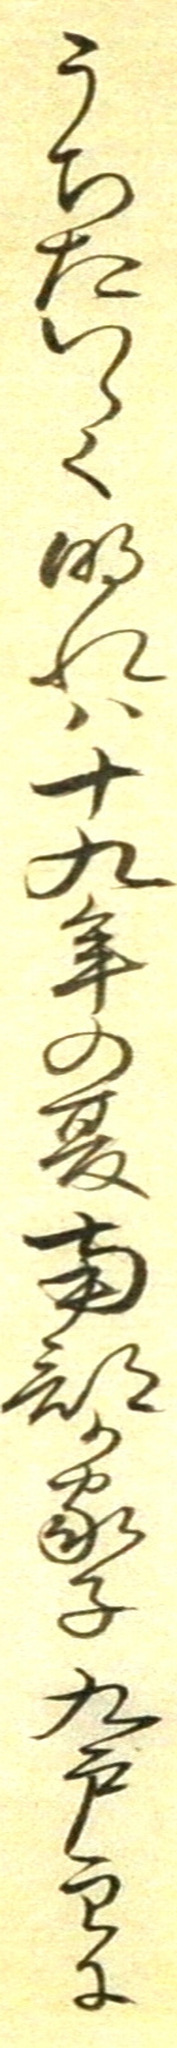うちたいらく明れハ十九年の夏南部か家子九戸主に
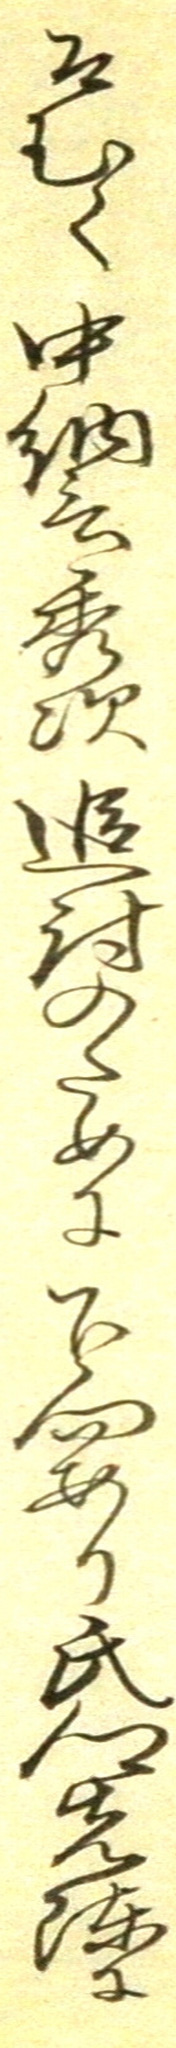そむく中納言秀次追討のために下向あり氏郷先陣に
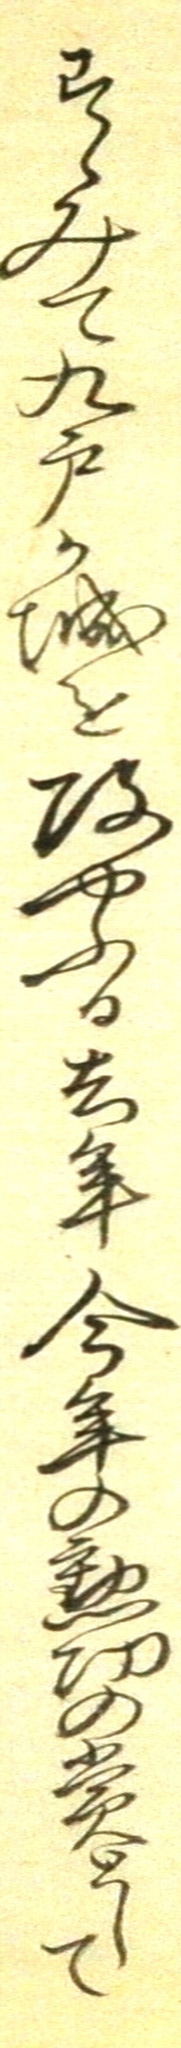すゝみて九戸か城を攻やふる去年今年の勲功の賞として
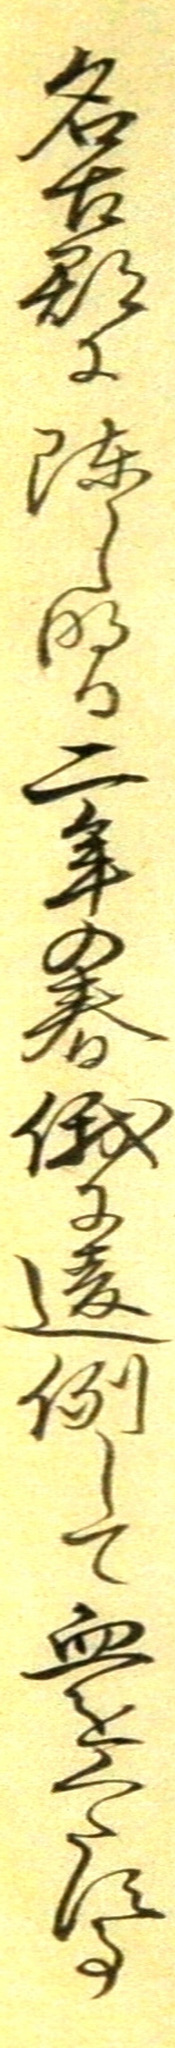名古屋に陣し明る二年の春俄に違例して血をくたす事

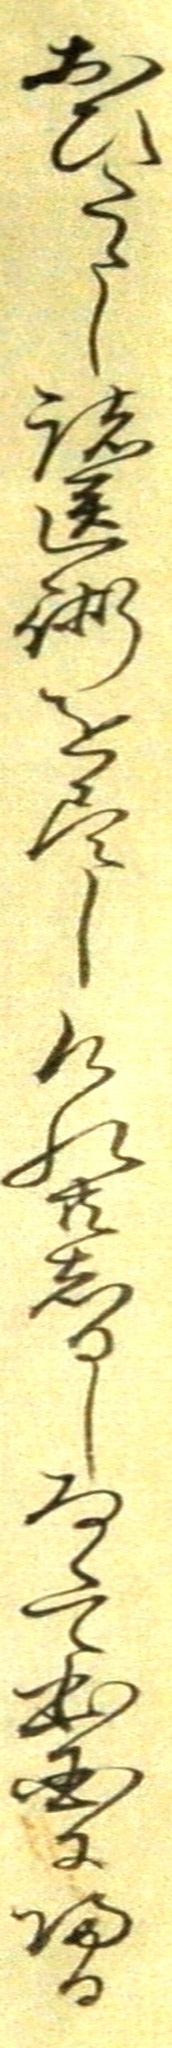おひたゝし諸医術を尽しけれ共しるしなくて本国に帰る
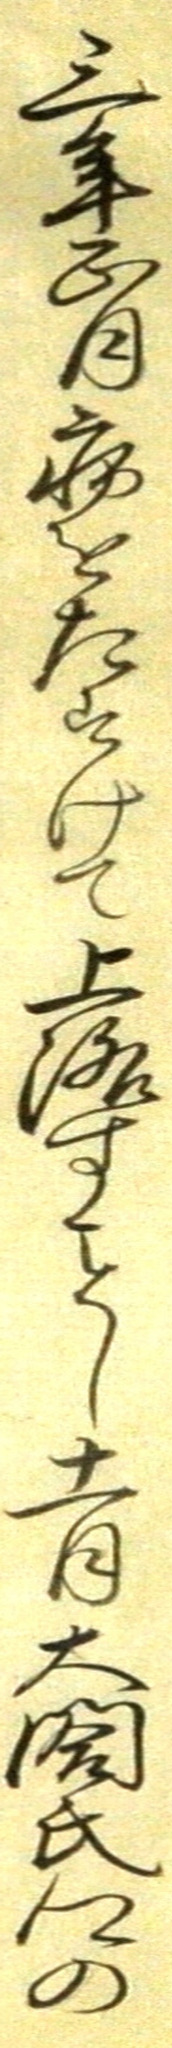三年正月病をたすけて上洛すことし十一月太閤氏郷の
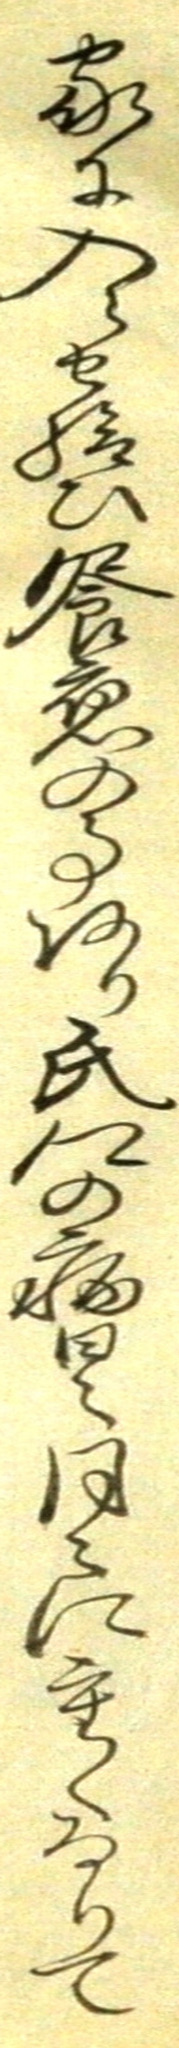家に入らせ給ひ餐応の事あり氏郷の病日々月々に重くなりて
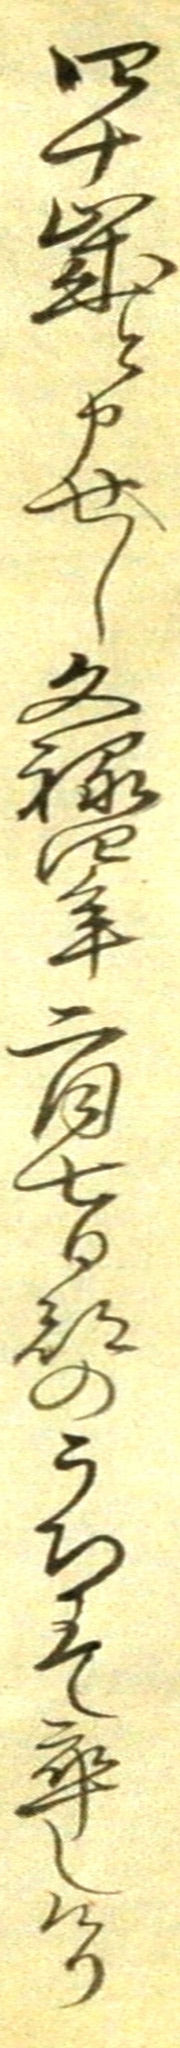四十歳と申せし文禄四年二月七日朝のうちにて卒しけり
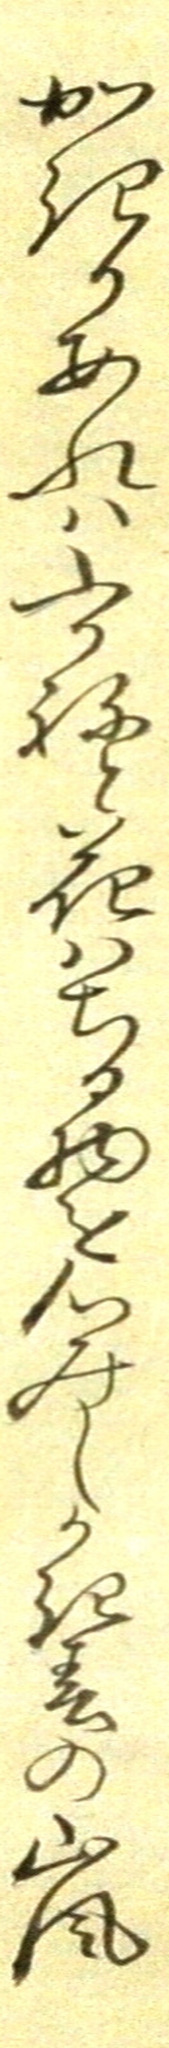かきりあれハふかねと花ハちる物を心みしかき春の山風
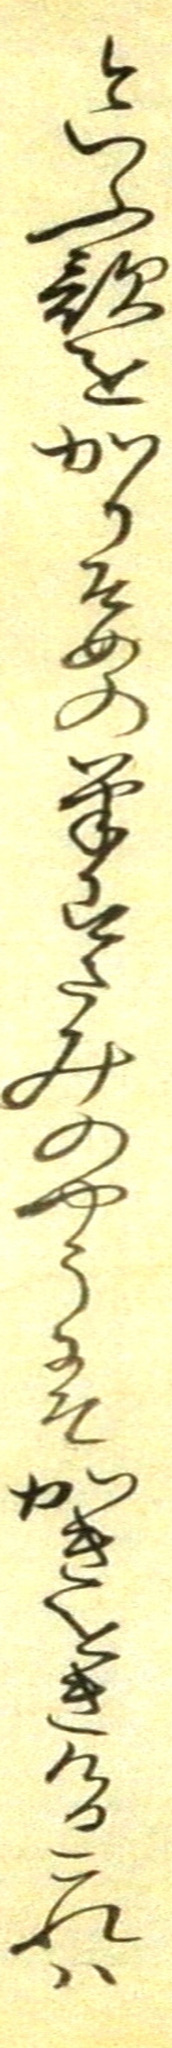といふ歌をかりそめの筆すさみのやうにそかきをきけるこれハ
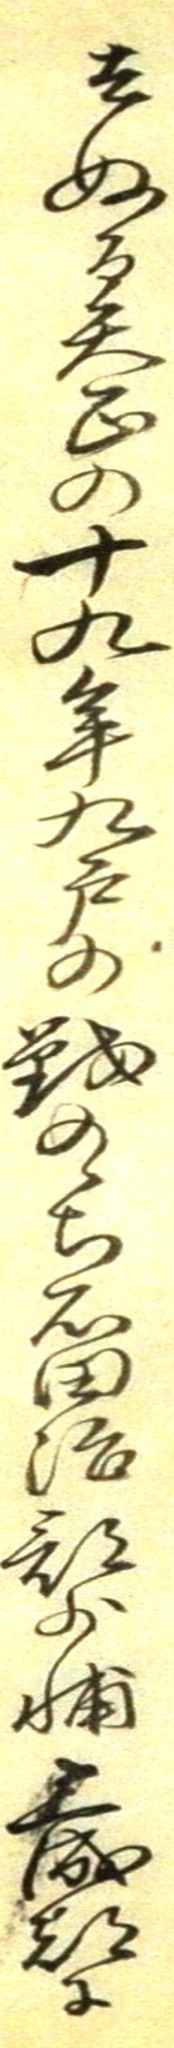去ぬる天正の十九年九戸の戦のゝち石田治部少輔三成都に
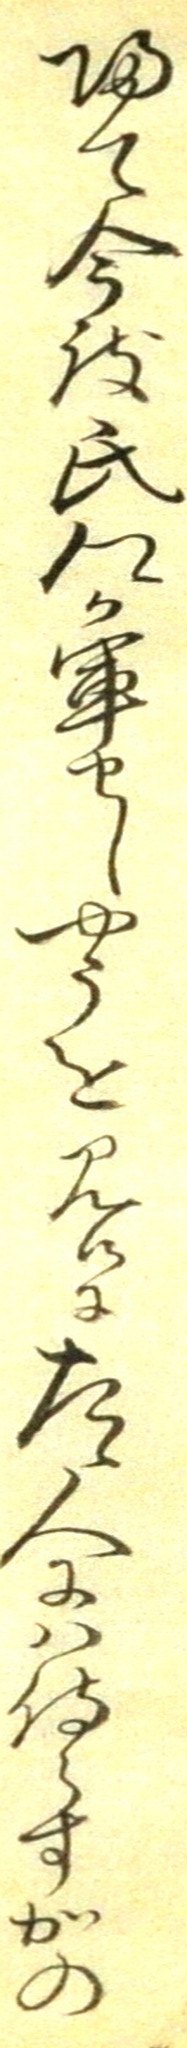帰て今度氏郷か軍せしやうを見候に左候人にハ侍らすガの
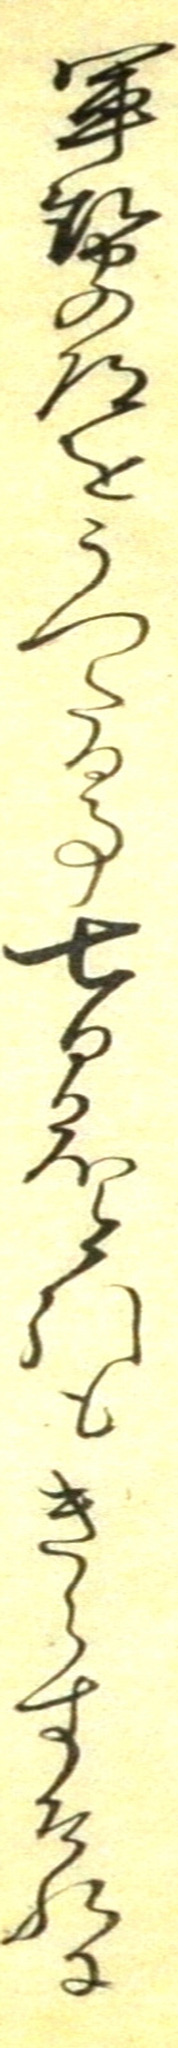軍勢の道をうつたる事七日前と引もきらすそれに
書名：藩翰譜（十二・上）
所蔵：伊那市立高遠町図書館・合同会社AMANE
